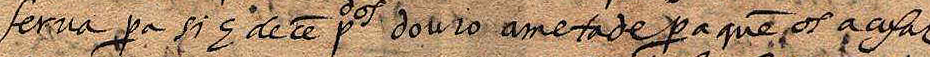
serua ꝑa si E de c̄e pdos douro ametade ꝑa quē os acusar
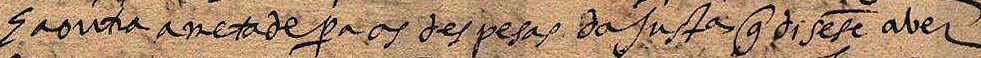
E a outra ametade ꝑa as despesas da Justa q̄ disēse a ver
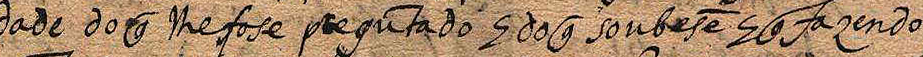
dade do q̄ lhe fose pregūtado E do q̄ soubesē E q̄ fazendo
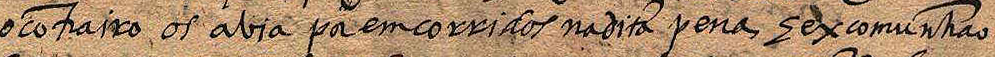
o c̄otrairo os avia por emcorridos na ditā pena E excomunhão
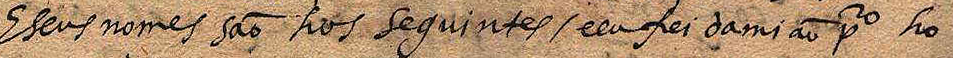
E seus nomes são hos seguintes / e eu frei damião pro ho
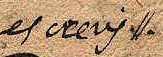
escreuj.//.
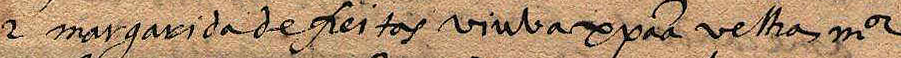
item margarida de freitas viuva xpāa velha mor
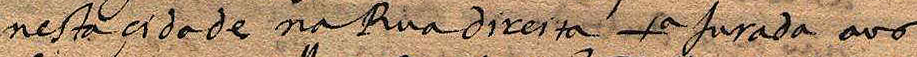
nesta çidade na Rua direita ta Jurada aos
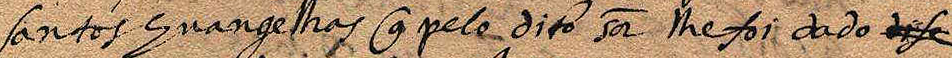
Santos Euangelhos q̄ pelo ditō s̄or lhe foi dado dise
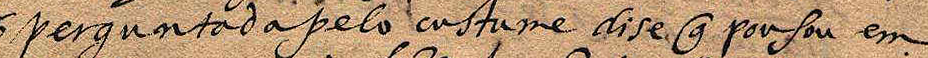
E perguntada pelo custume dise q̄ pousou em
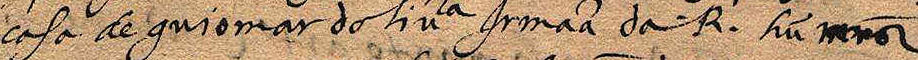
casa de guiomar doliura Jrmaā da .R. hū mes
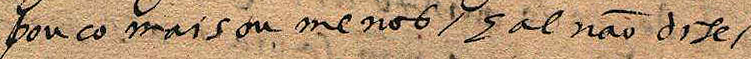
pouco mais ou menos / E al não dise /
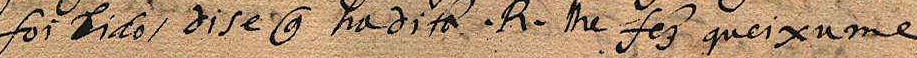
foi lido / dise q̄ ha ditā .R. lhe fez̄ queixume
